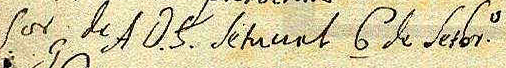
S.or de A V. S. Setuual 6 de Setbr.o
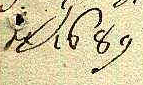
de 1689
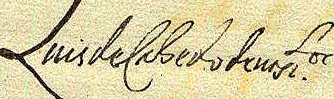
Luis de Cabedo de uasc.los
